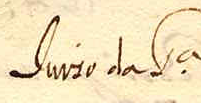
Juizo da T.a
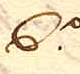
6.o
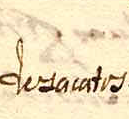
dezacatos
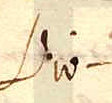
Vio
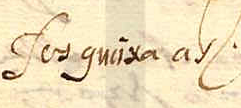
fes queixa a R.
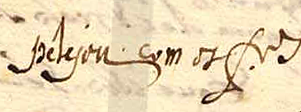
pelejou com os f.os
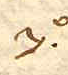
7.o
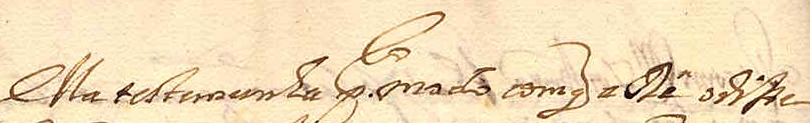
Ella testemunha p.lo modo com q̄ a Ré o disse
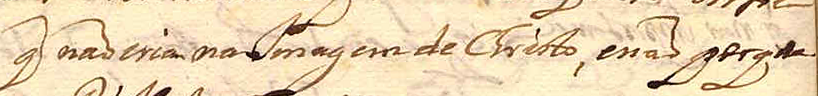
q̄ naõ cria na Imagem de Christo, e naõ porque
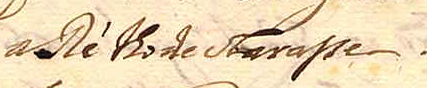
a Ré lho declarasse
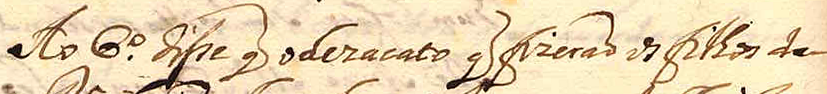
Ao 6.o disse q̄ o dezacato q̄ fizerão os filhos da
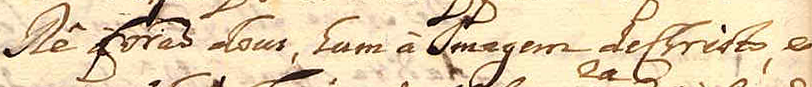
Ré forão dous, hum à Imagem de Christo, e
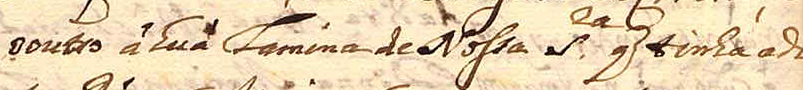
o outro à huā Lamina de Nossa S.ra q̄ tinha a di
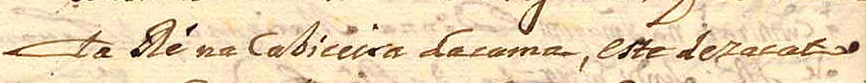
ta Ré na cabiceira da cama, este dezacato
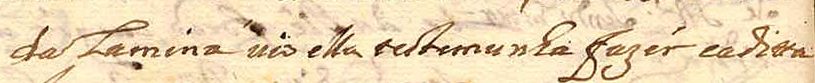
da Lamina uio ella testemunha fazer e a ditta
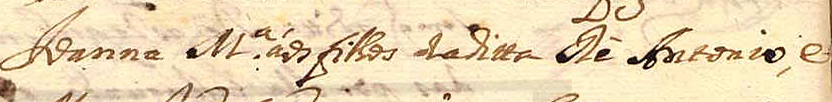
Ioanna M.a aos filhos da ditta Ré Antonio, e
